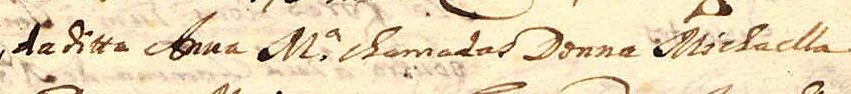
da ditta Anna M.a chamadas Donna Michaella
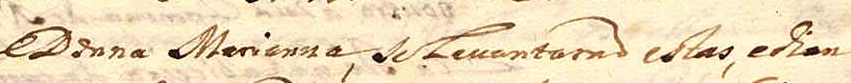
e Donna Marianna, se Leuantaraõ estas, e dian
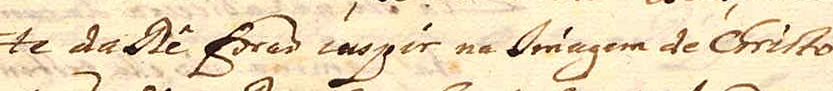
te da Ré forão cuspir na Imagem de Christo
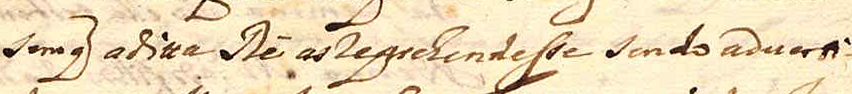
sem q̄ a ditta Ré as Reprehendesse sendo aduerti
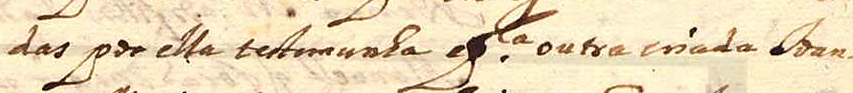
das por ella testemunha e p.la outra criada Ioan
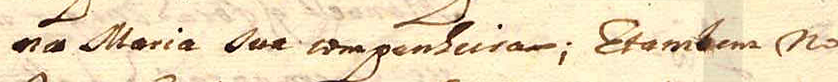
na Maria sua companheira; E tambem no
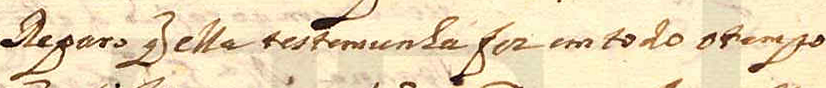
Reparo q̄ ella testemunha fez em todo o tempo
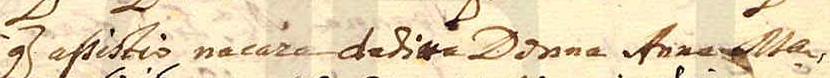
q̄ assistio na caza da ditta Donna Anna Ma.
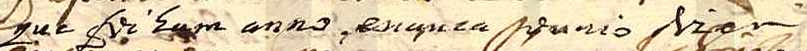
que foi hum anno, e nunca ouuio dizer
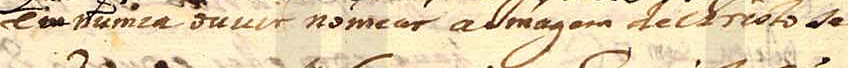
em numca ouuir nomear a Imagem de christo se
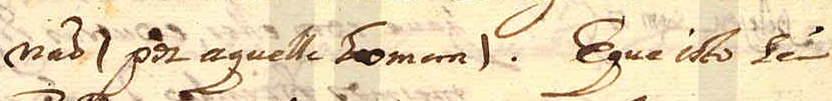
naõ (por aquelle homem). E que isto hé
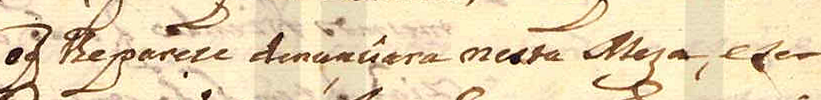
o q̄ lhe parece denuncîara nesta Meza, e ser
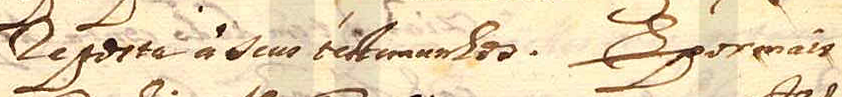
Reposta à seus testemunhos. E por mais
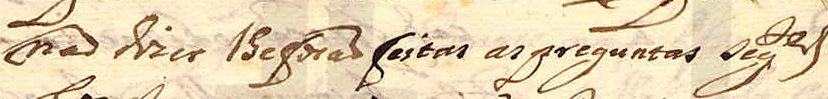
naõ dizer lhe foraõ feitas as preguntas segtes
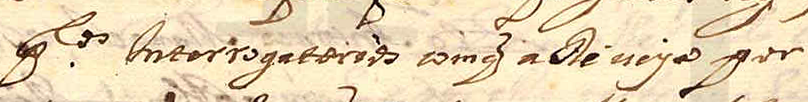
p.los Interrogatorios com q̄ a Ré ueyo por
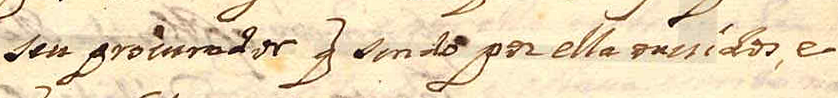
seu procurador q̄ sendo por ella ouuidos, e
